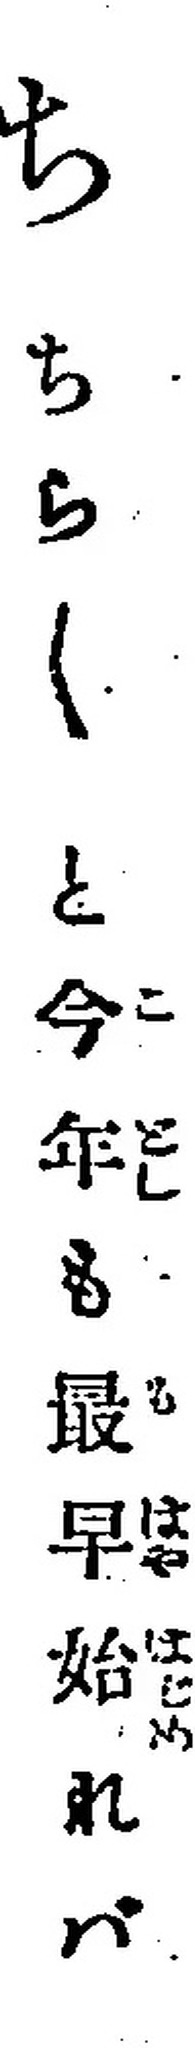ちちら〳〵と今年も最早始れば
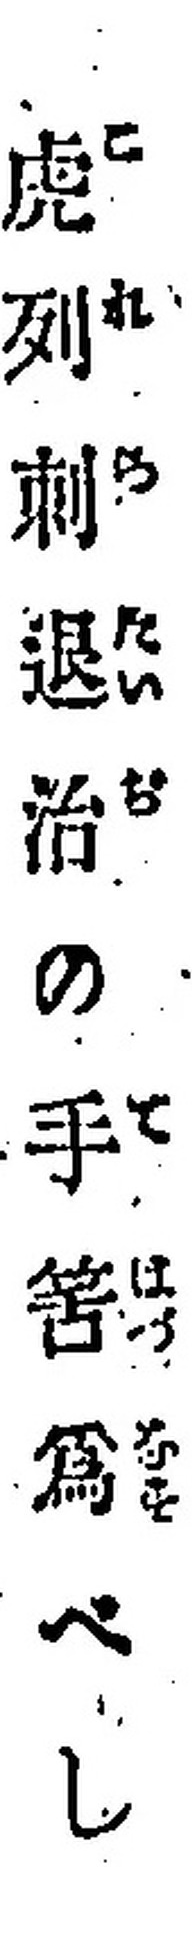虎列刺退治の手筈為べし
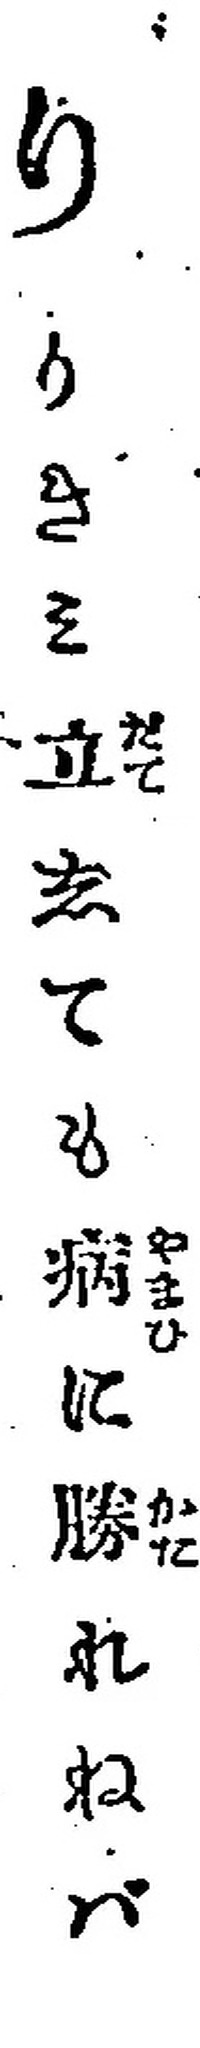りりきみ立しても病に勝れねば
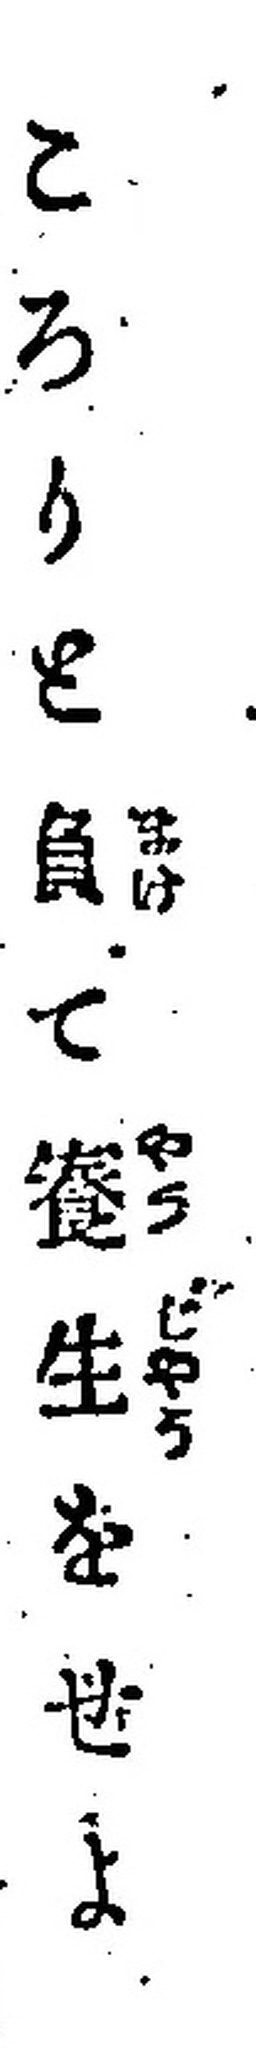ころりと負て養生をせよ
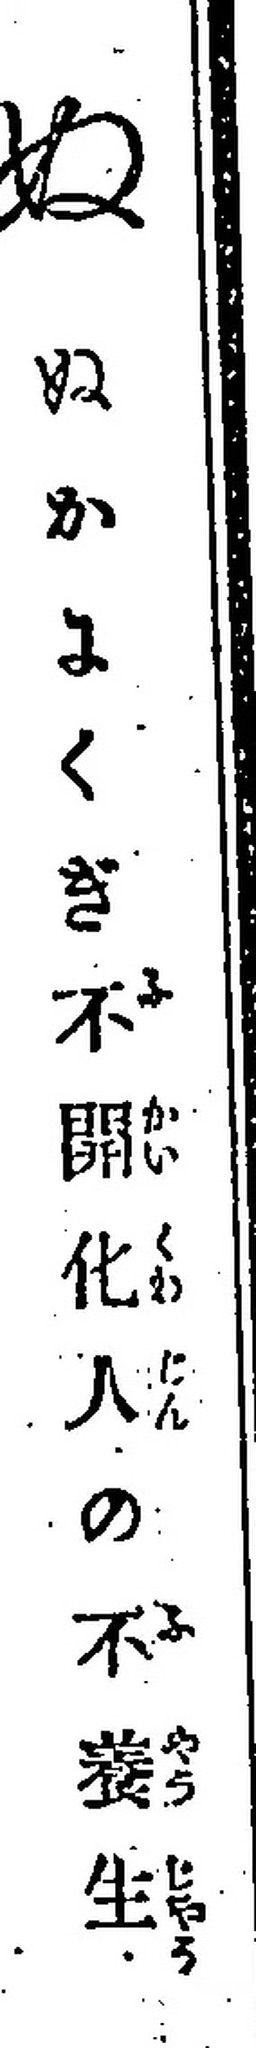ぬぬかにくぎ不開化人の不養生
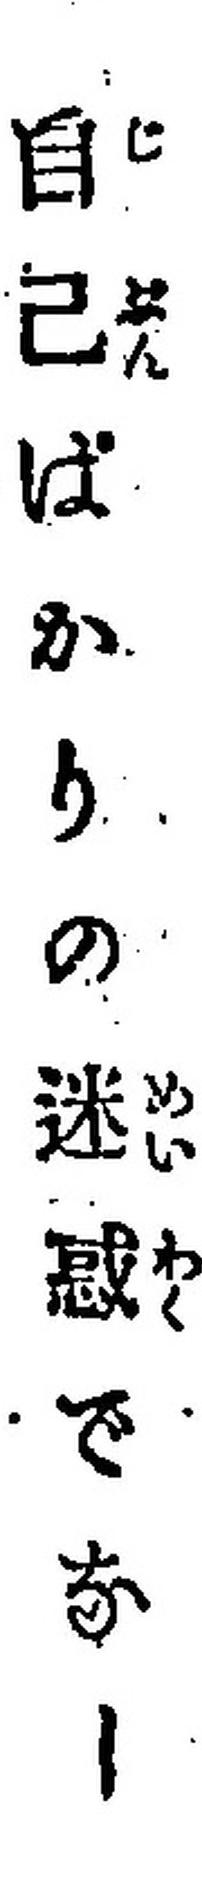自分はかりの迷惑でなし
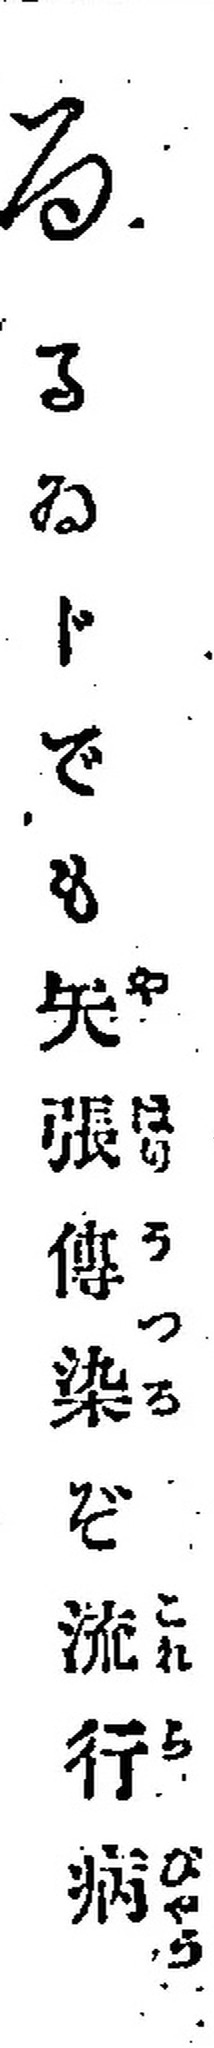るるゐじでも矢張傳染ぞ流行病
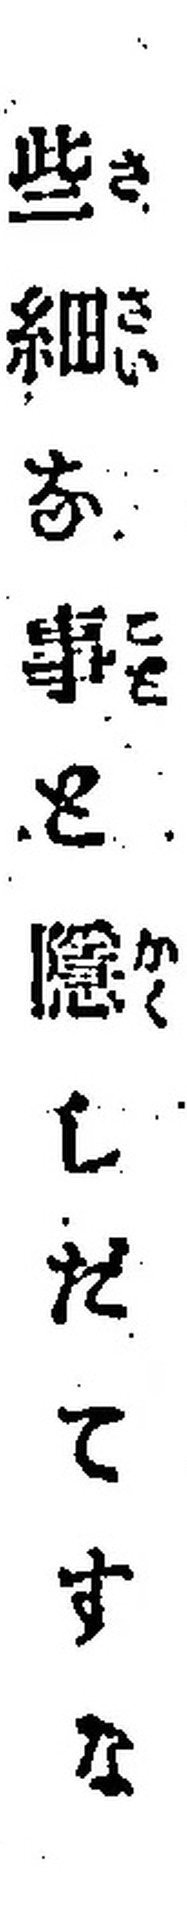些細な事と隠しだてすな
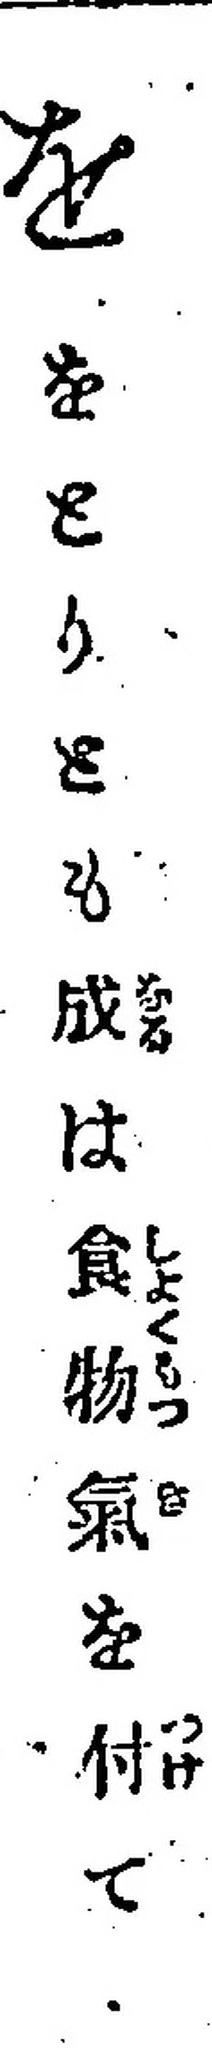ををとりとも成は食物氣を付て
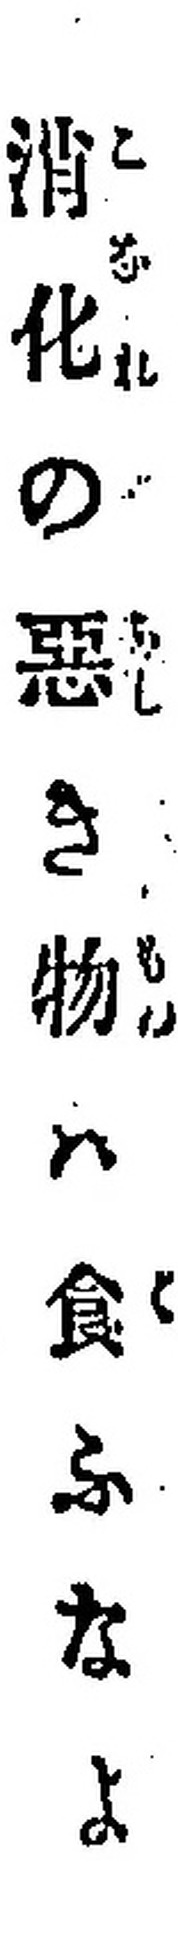消化の惡き物は食ふなよ
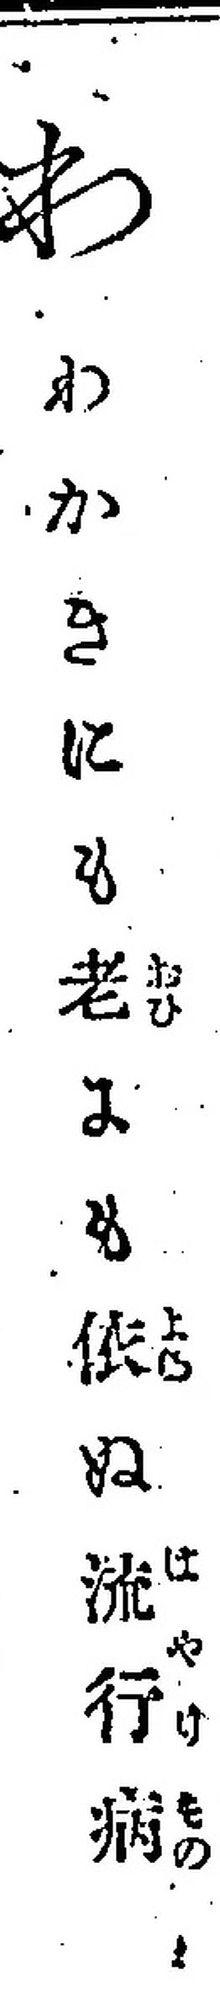わわかきにも老にも依ぬ流行病
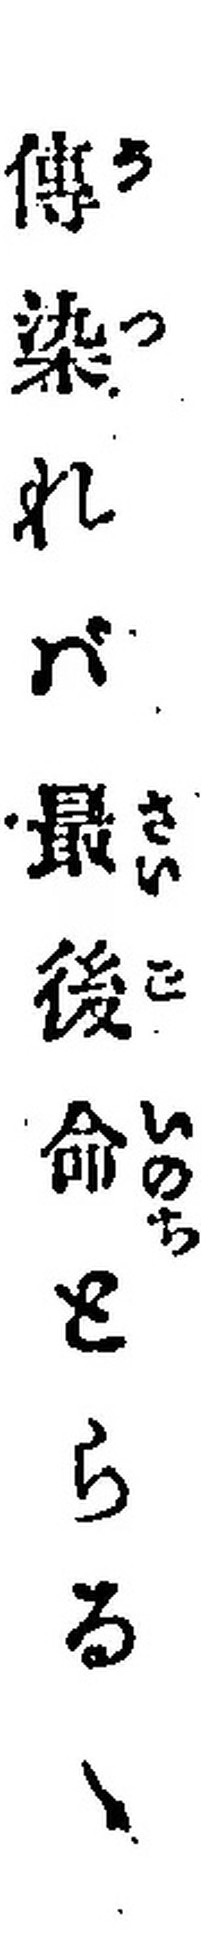傳染れば最後命とらるゝ
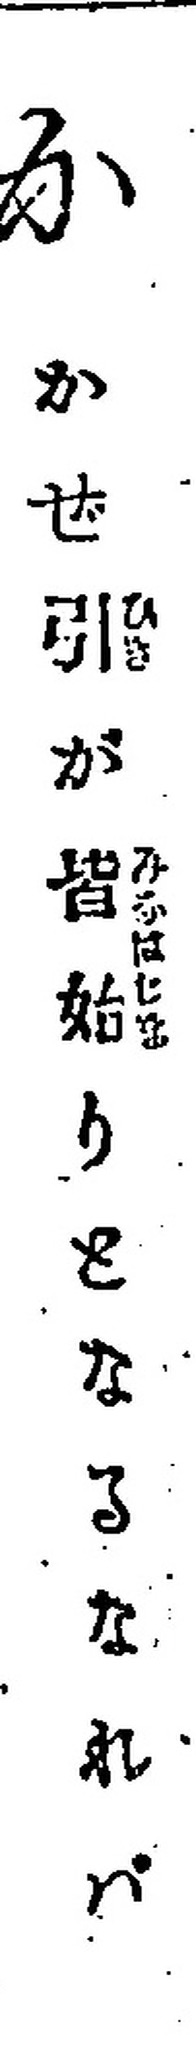かかぜ引が皆始りとなるなれば
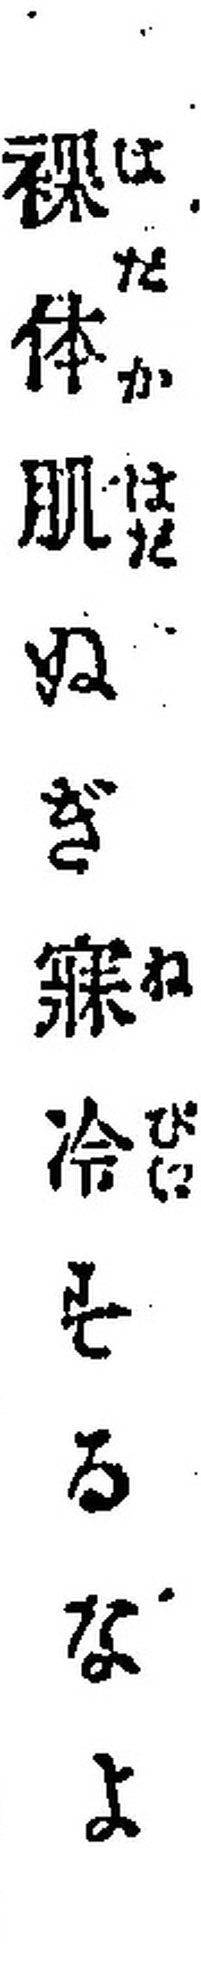裸体肌ぬき寝冷するなよ

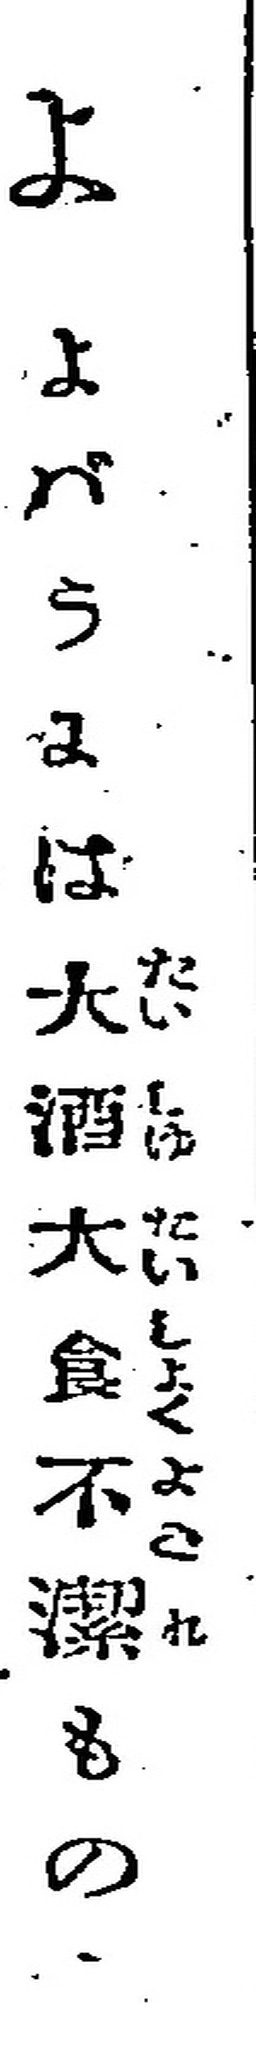よよばうには大酒大食不潔もの
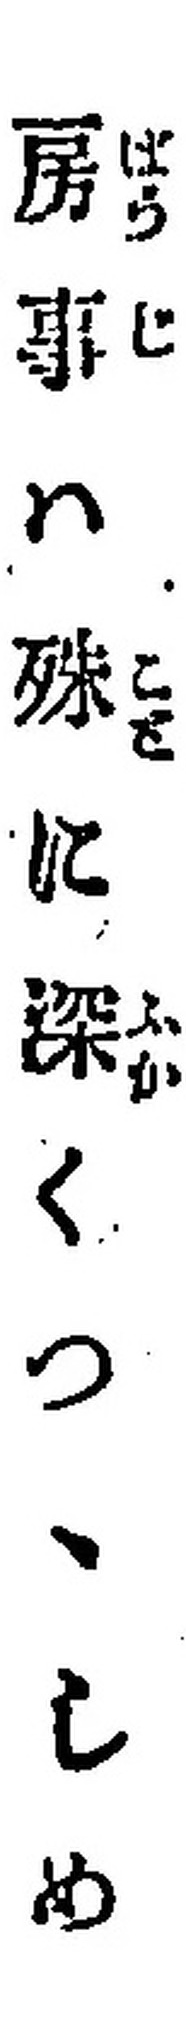房時は殊に深くつゝしめ
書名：新撰暑中養生法 : 附・コレラ予防歌
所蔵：国立国会図書館 National Diet Library, JAPAN
